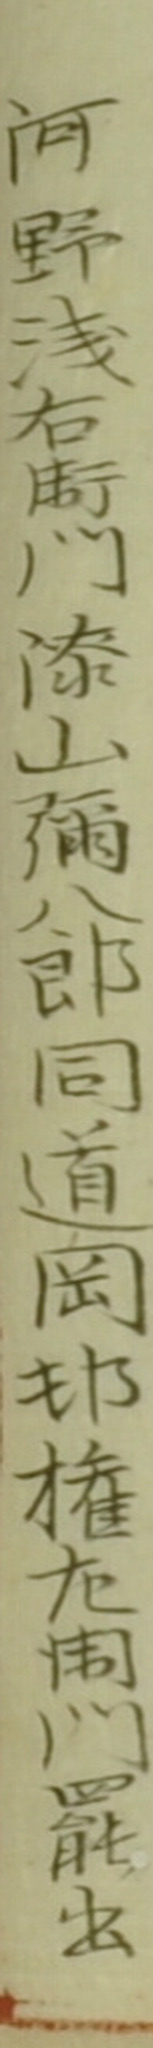河野浅右衛門漆山彌八郎同道岡邨権左衛門罷出
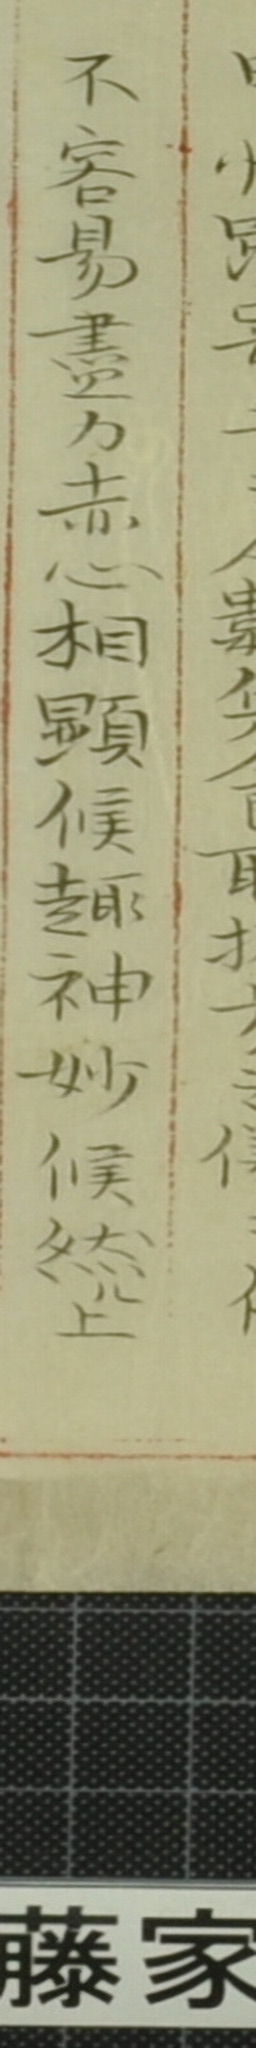不容易盡力赤心相顕候趣神妙候然ル上
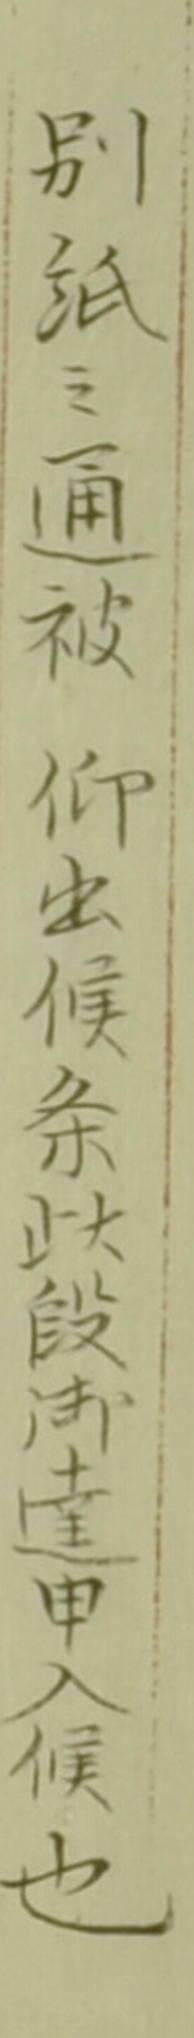別紙之通被仰出候条此段御達申入候也
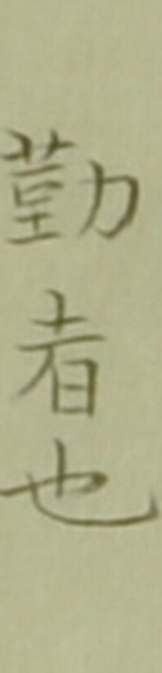勤者也
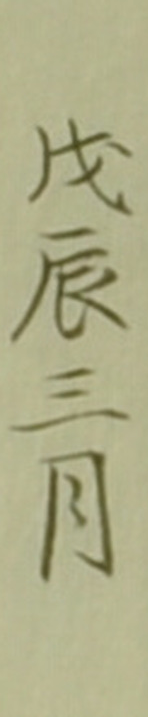戊辰三月

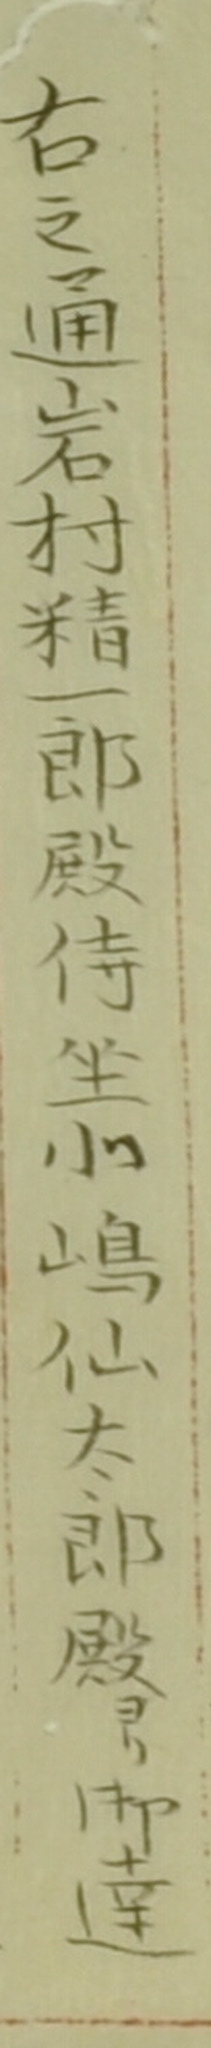右之通岩村精一郎殿侍坐北嶋仙太郎殿ヨリ御達
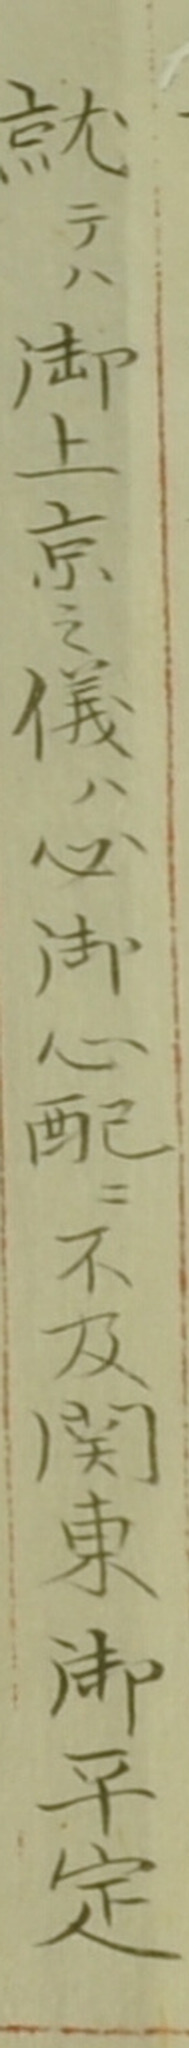就テハ御上京之儀ハ必御心配ニ不及関東御平定
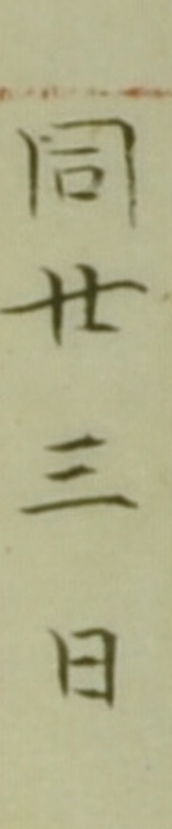同廿三日
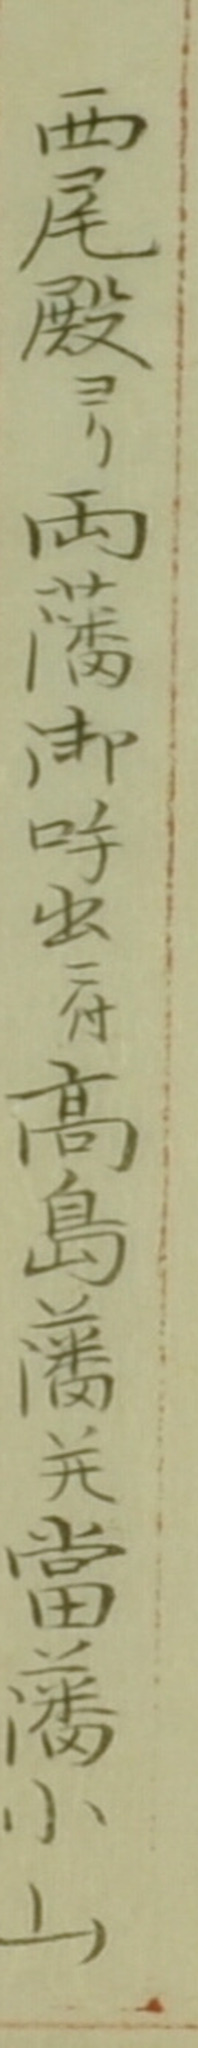一西尾殿ヨリ両藩御呼出ニ付高島藩并當藩小山
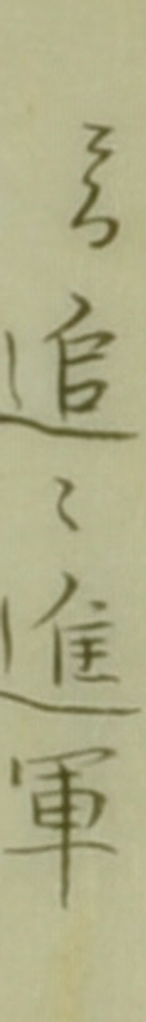ニ而追々進軍
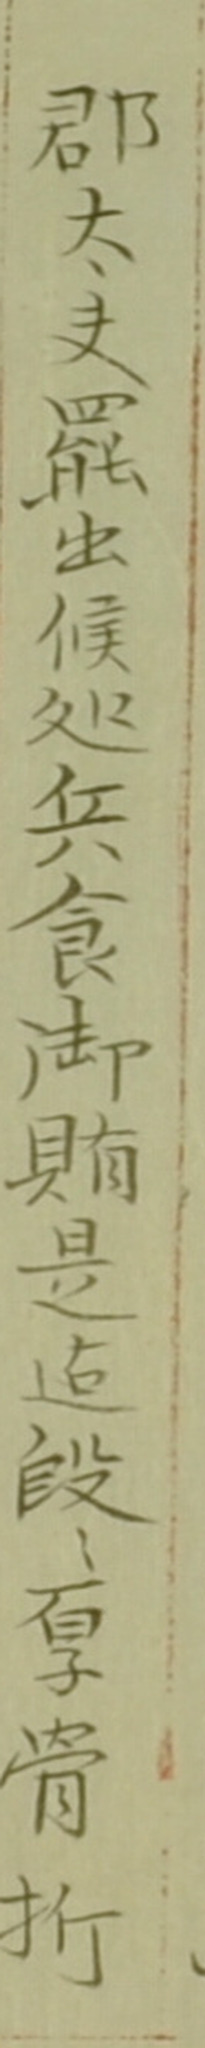郡太夫罷出候処兵食御賄是迄段々厚骨折
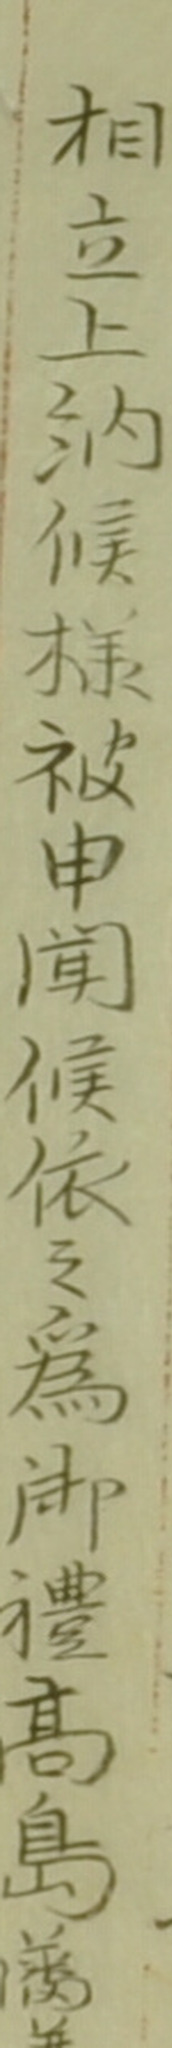相立上納候様被申聞候依之為御禮高島藩并
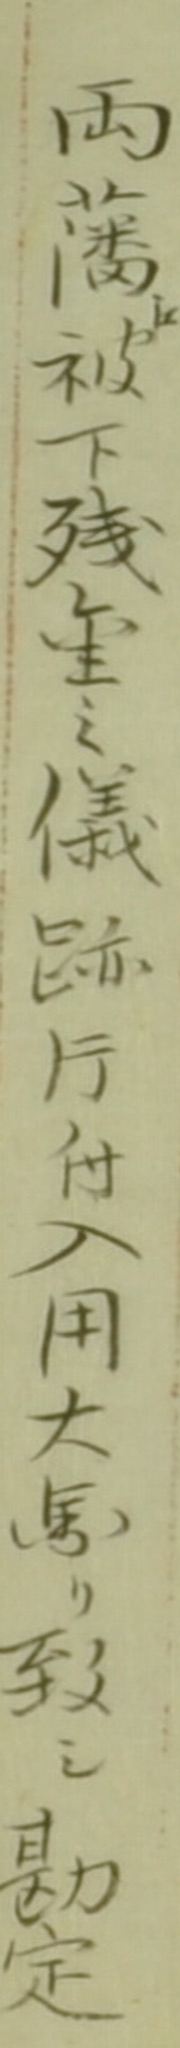両藩江被下残金之儀跡片付入用大圖リ致シ勘定
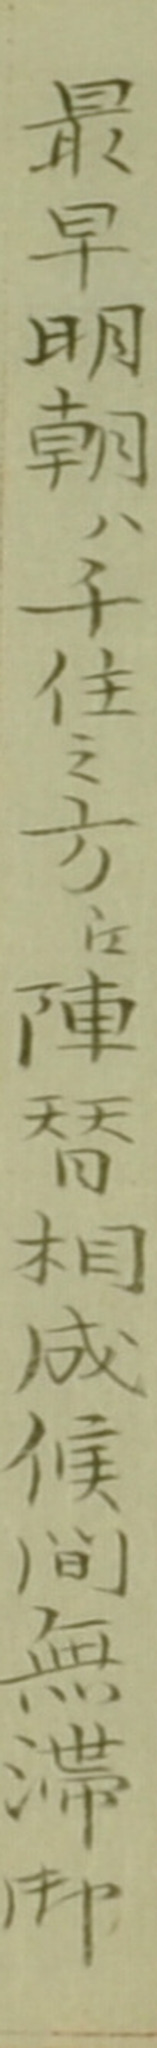最早明朝ハ千住之方江陣替相成候間無滞御
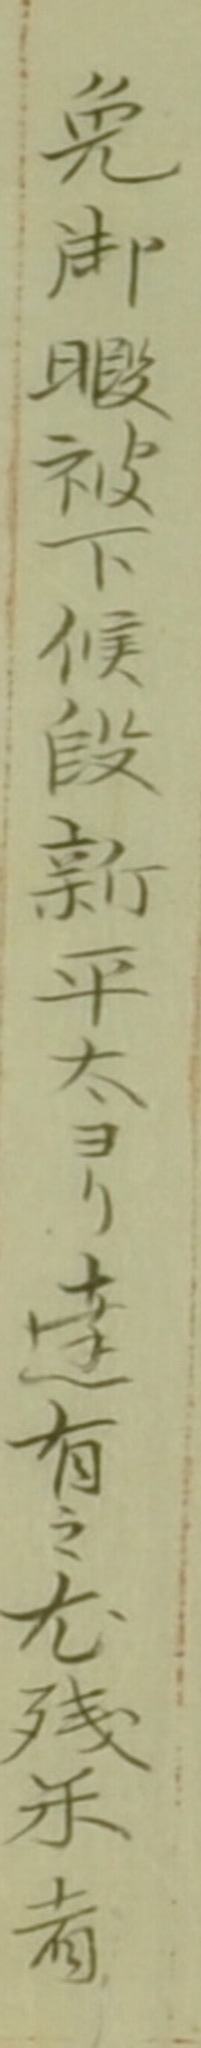免御暇被下候段新平太ヨリ達有之尤残米者
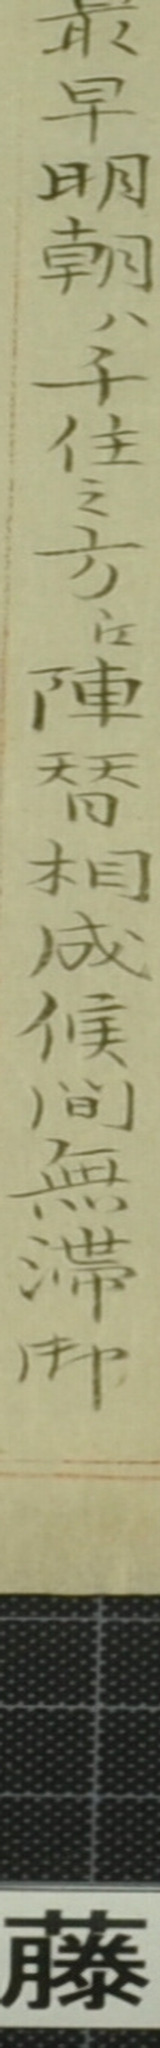最早明朝ハ千住之方江陣替相成候間無滞御
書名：御東征ニ付甲州口兵食人馬御賄之事件（控）
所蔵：伊那市立高遠町図書館・合同会社AMANE
